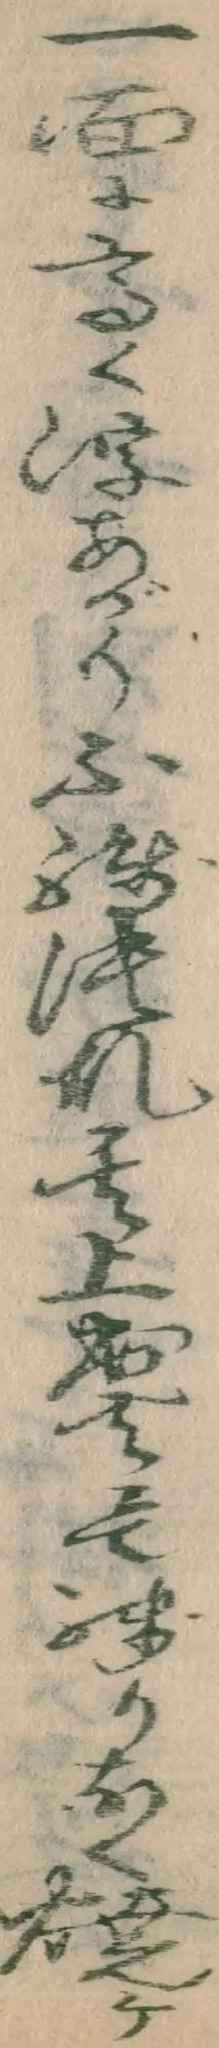一面に高く浮あがり不残潰れ其上出火二て残りなく焼ヶ
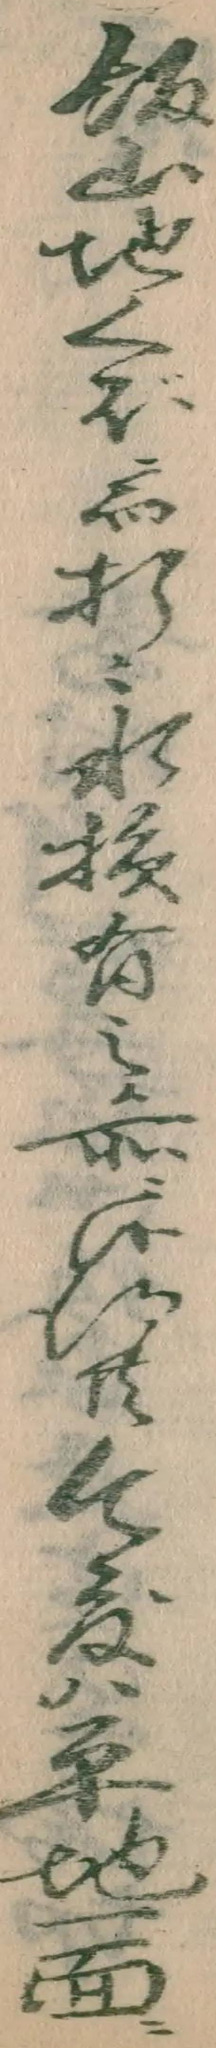飯山地くぼ二而折々水損有之候所二候得共今度は平地一面二
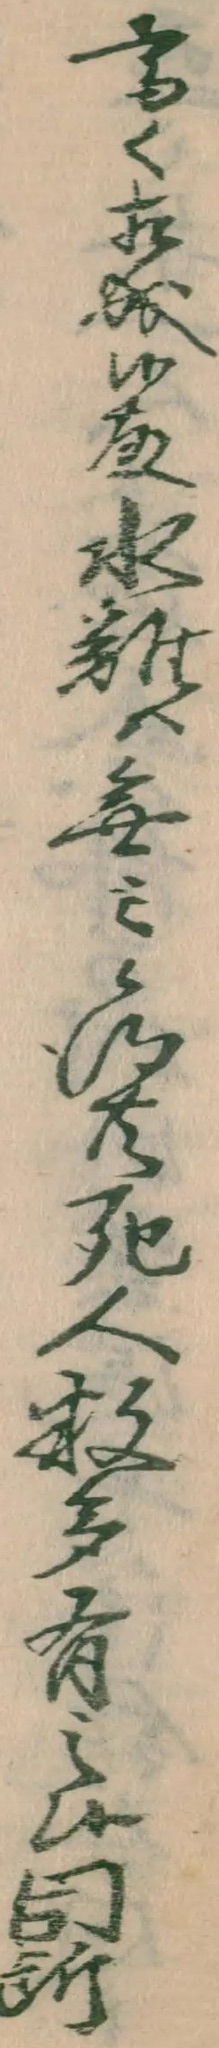高く相成候故水難は無之候得共死人数多有之候同所
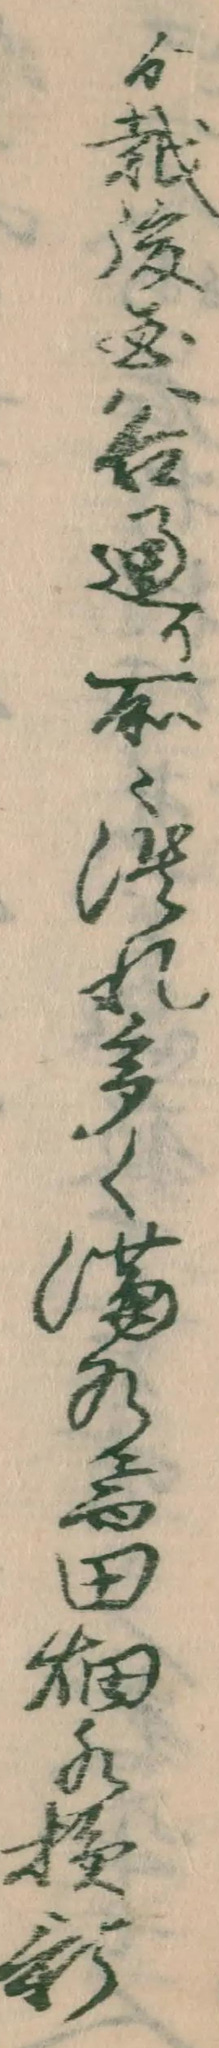ゟ越後国谷通り所々潰れ多く満水二而田畑水損新
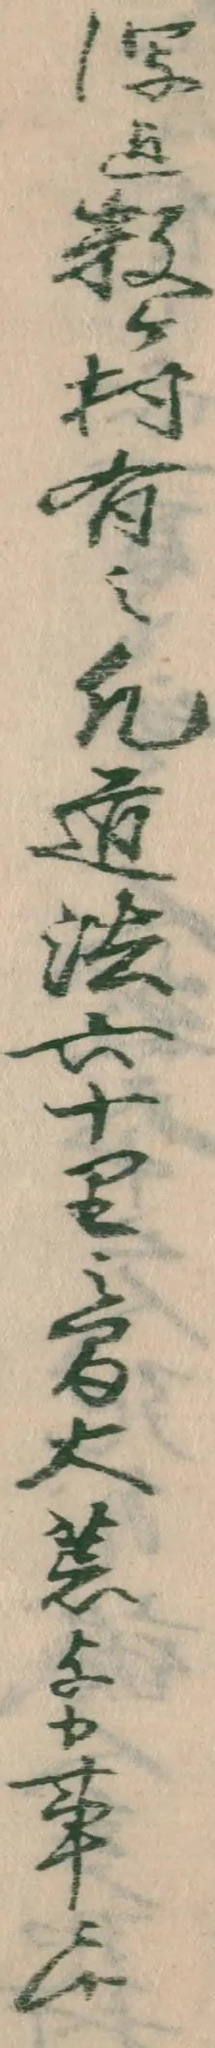潟迄数ヶ村有之凡道法六十里之間大荒与申事二候
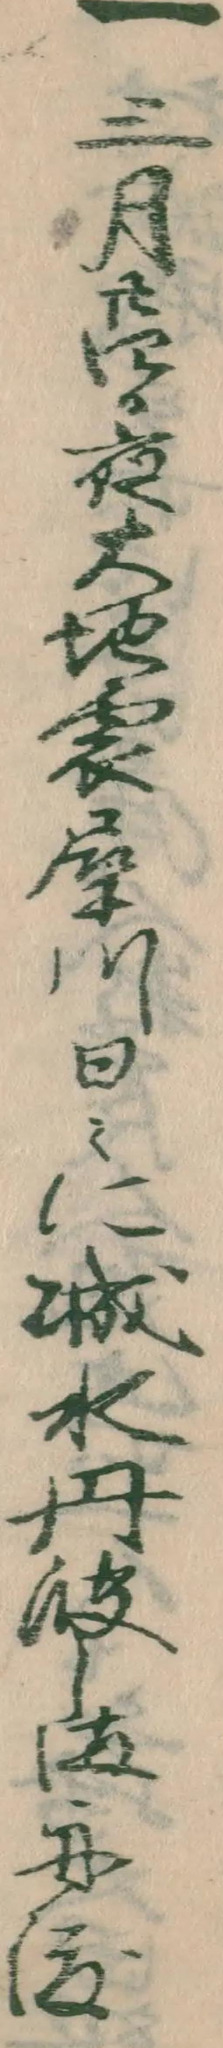一三月廿四日夜大地震犀川日々に減水丹波しま舟渡
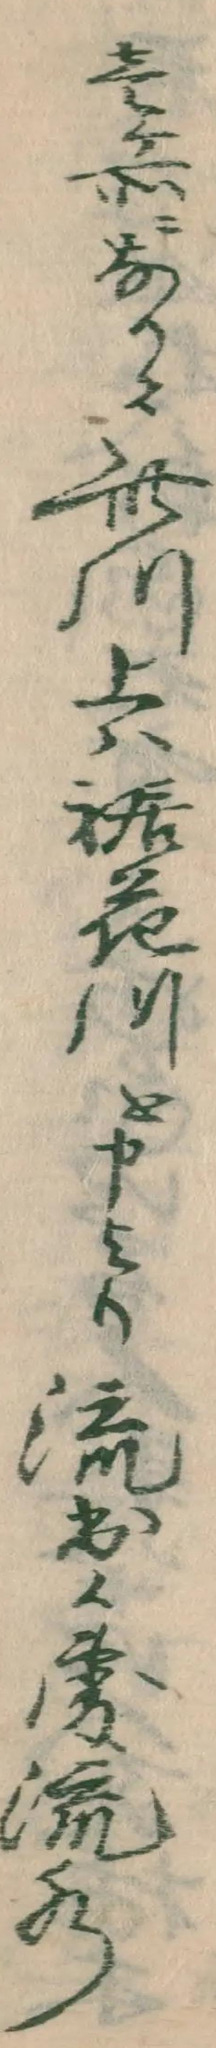壱ヶ所二なり候此川上は裾花川と申より流出候処流水
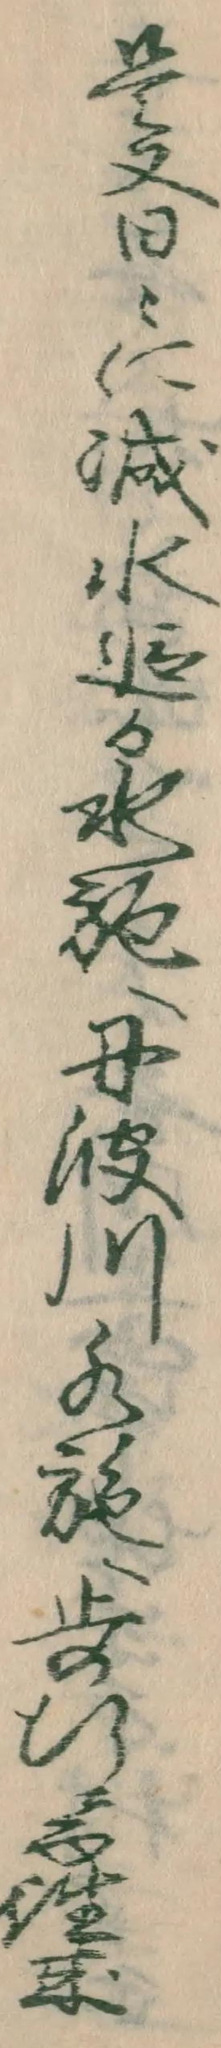是又日々に減水追々水絶へ丹波川水絶へ歩行二而往来
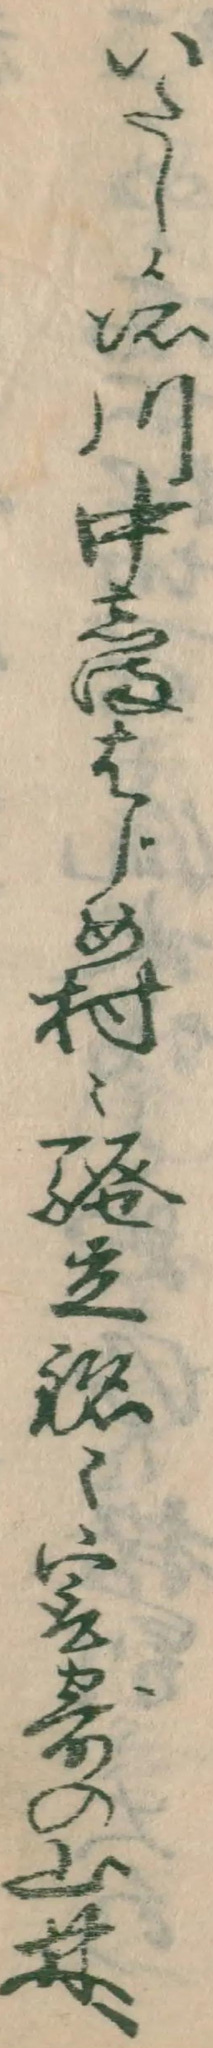いたし候所川中しまはじめ村々騒立銘々最寄の山林へ
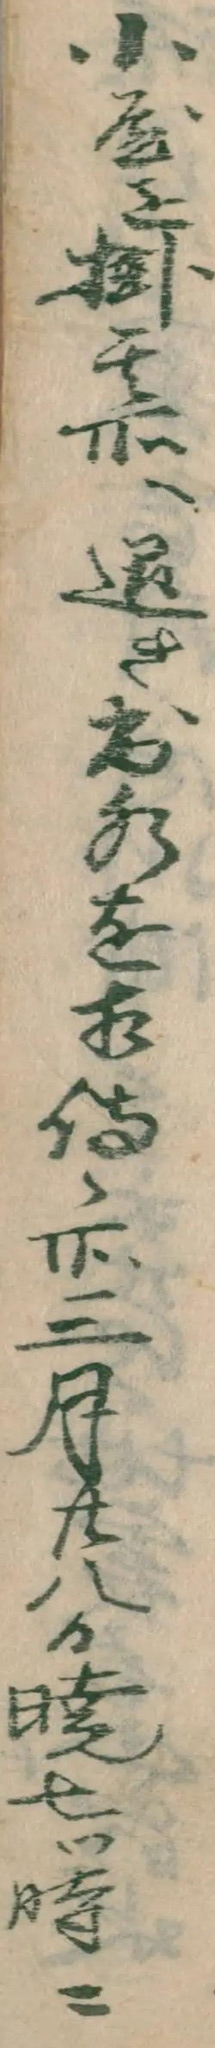小屋を掛其所へ退き出水を相待候所三月廿八日暁七ッ時二

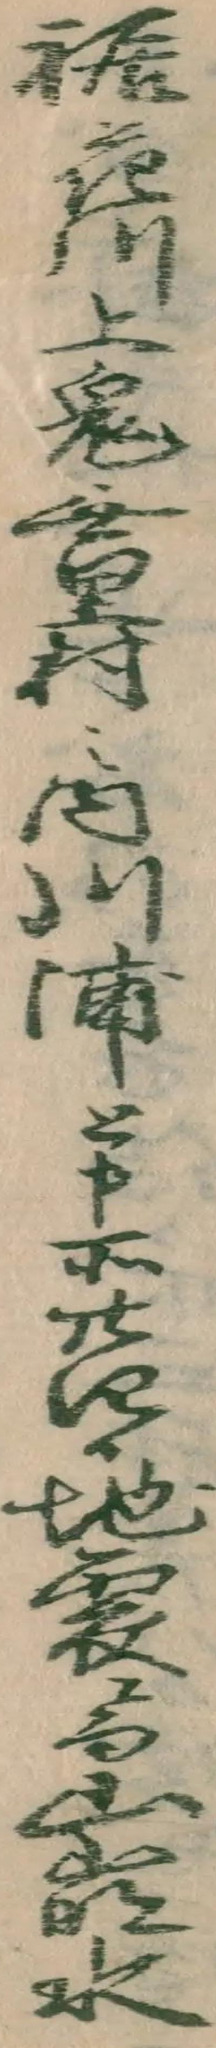裾花川上鬼無里村之内川浦と申所廿四日地震為二而山崩水
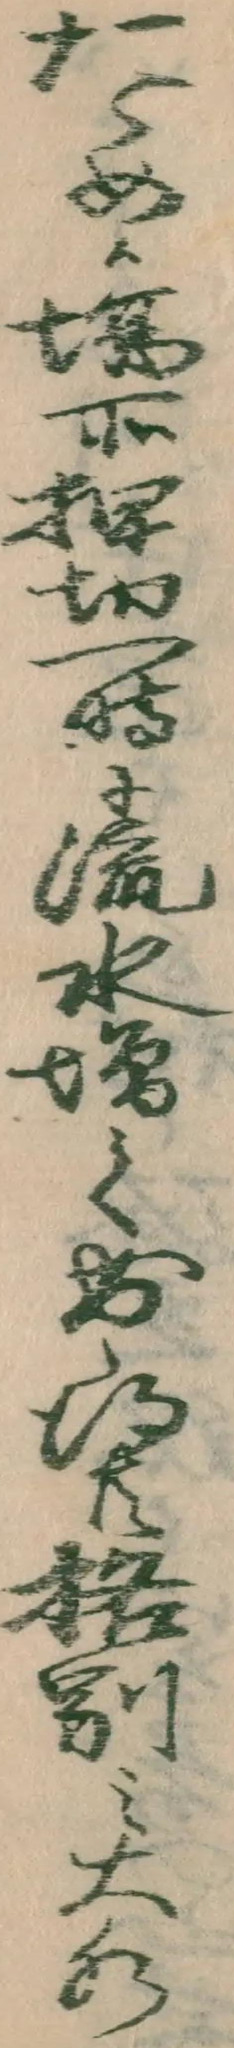たゝめ候場所押切一時に流水増て出候得共格別之大水
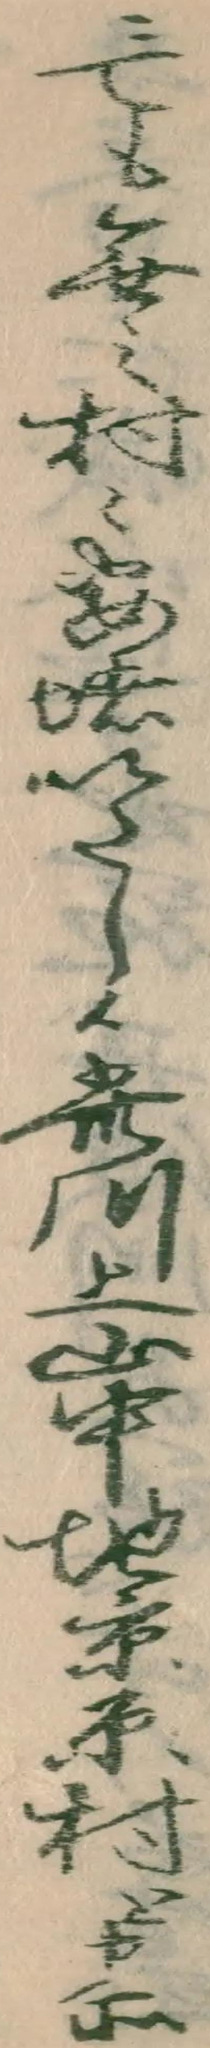にても無之村々安堵いたし候此川上山中地京原と申所
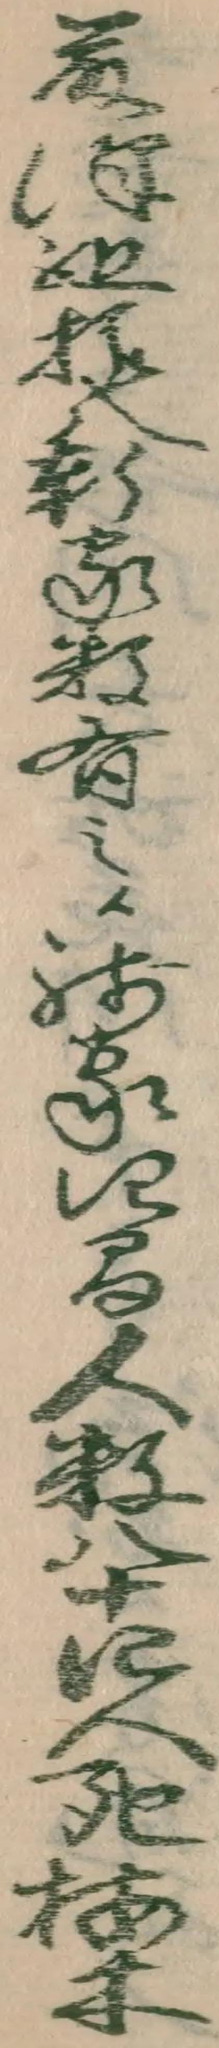藤沢組拾八軒家数有之候残家四間人数八十四人死梅木
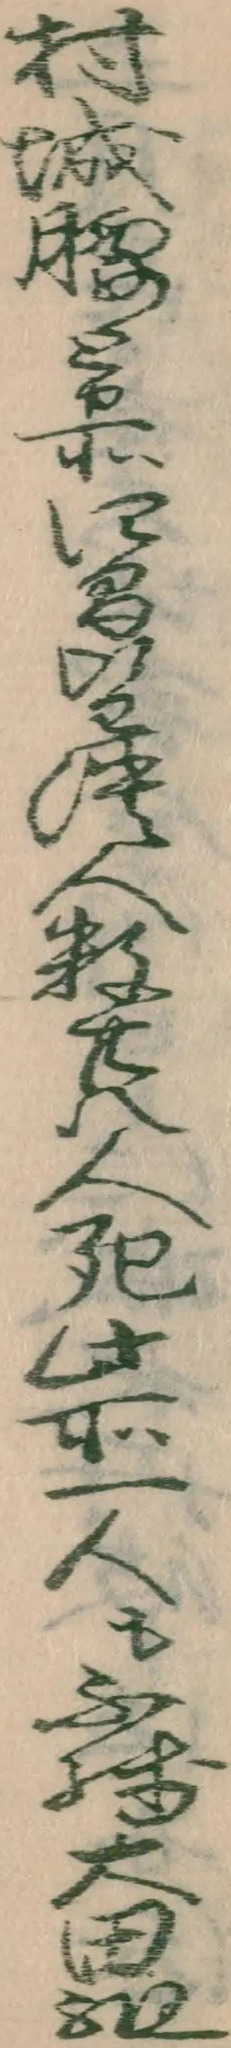村城腰と申所四間皆潰人数廿八人死此所一人も不残大田組
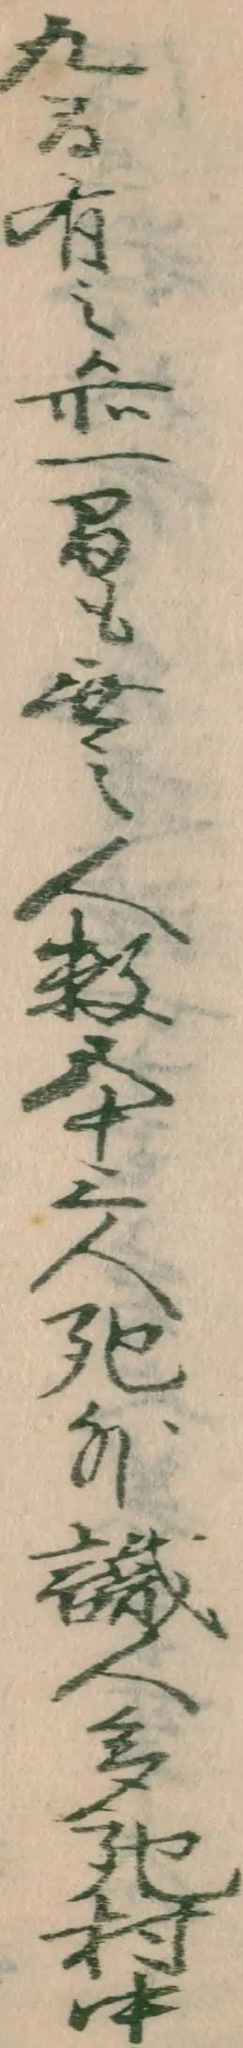九間有之候所一間も無之人数五十三人死外識人多死村中
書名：大地震
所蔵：国立国会図書館 National Diet Library, JAPAN
